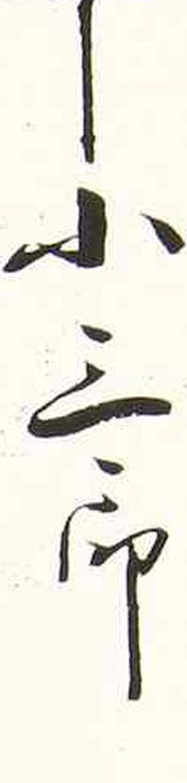小三郎
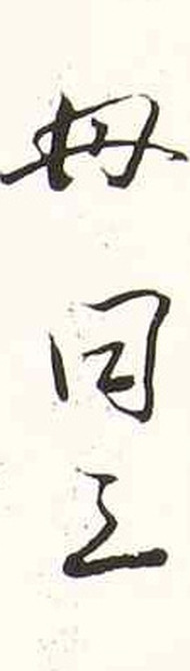母同上
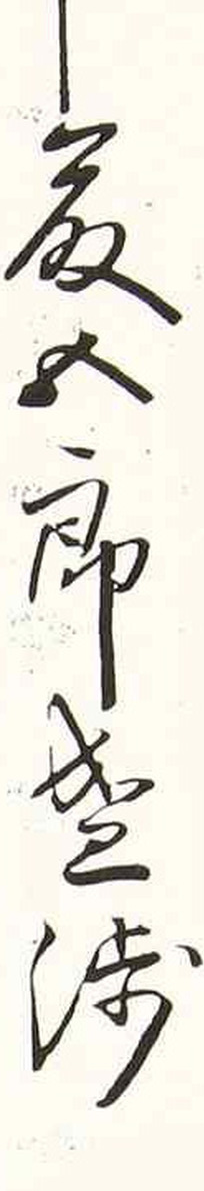藤五郎盛渉
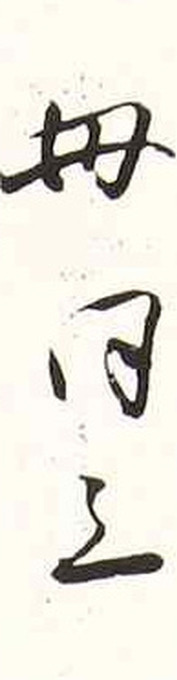母同上
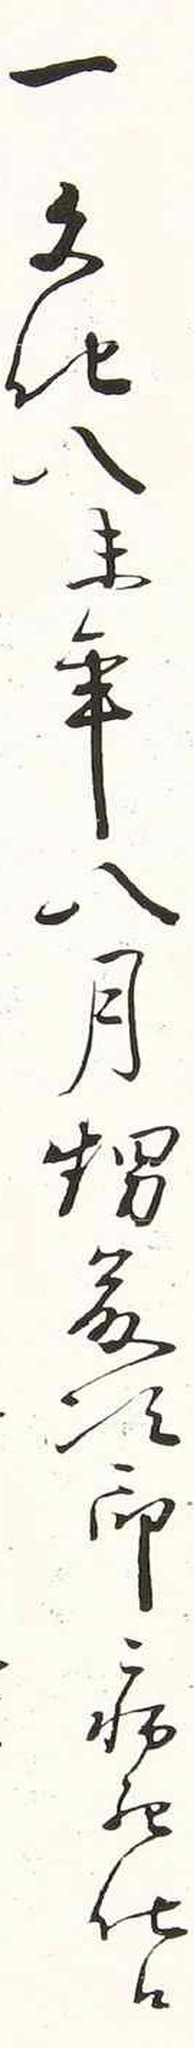一文化八未年八月甥藤次郎病死仕候
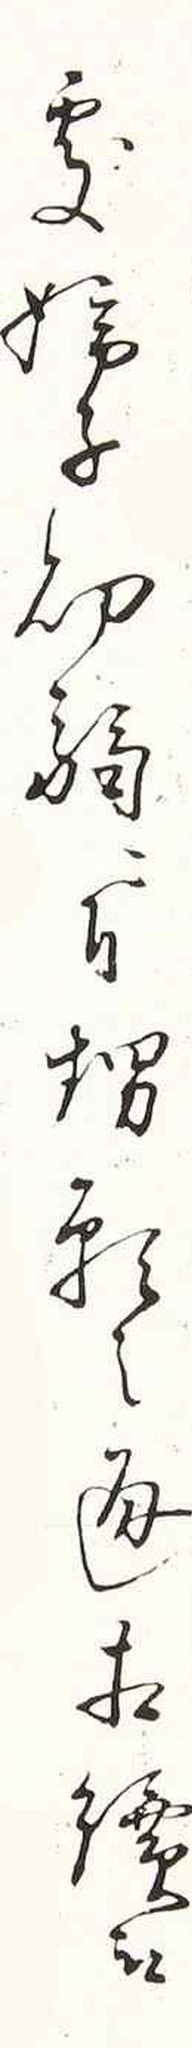処嫡子幼弱ニ而甥願之通相続被
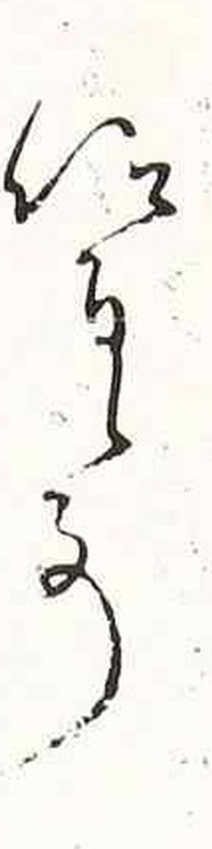仰下候事
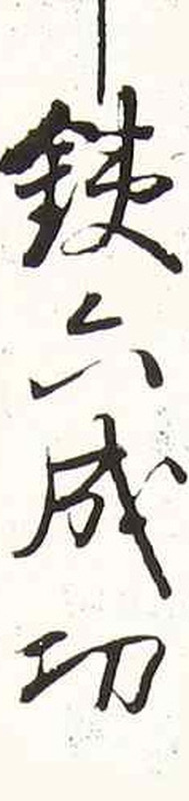鉄六成功
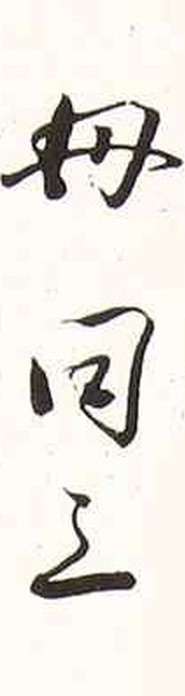母同上
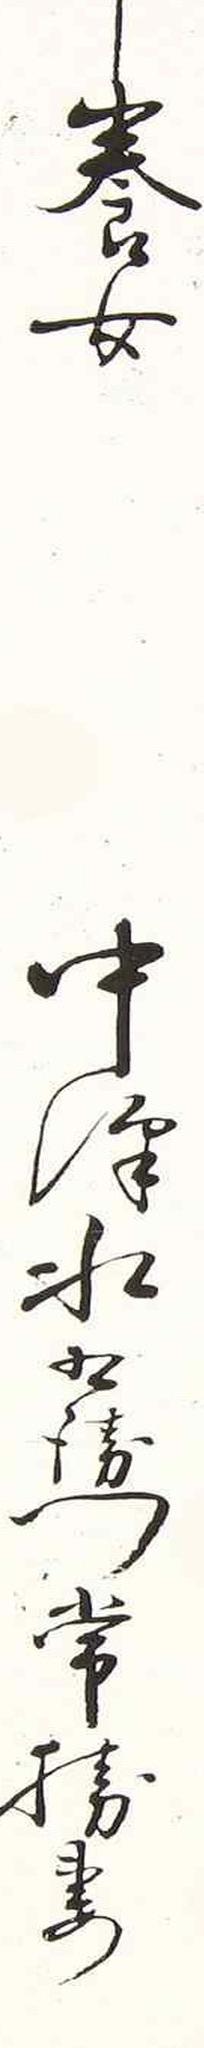養女中沢水右衛門常勝妻
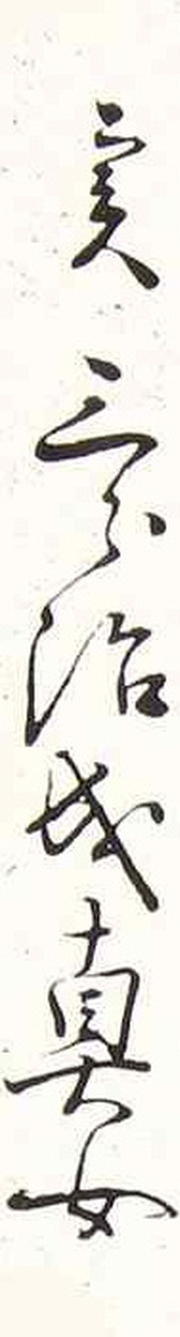実三郎治成真女
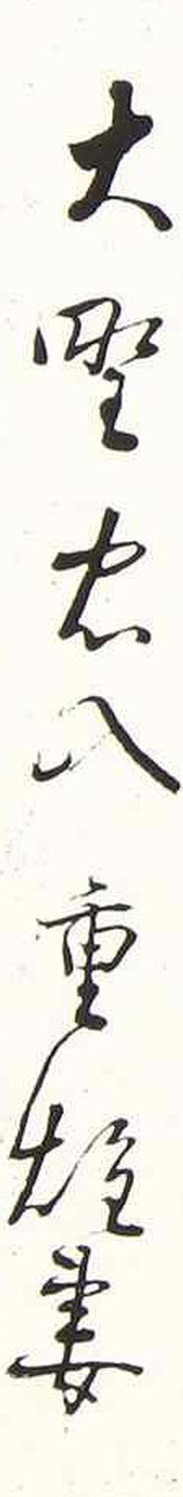女大野忠八重雄妻
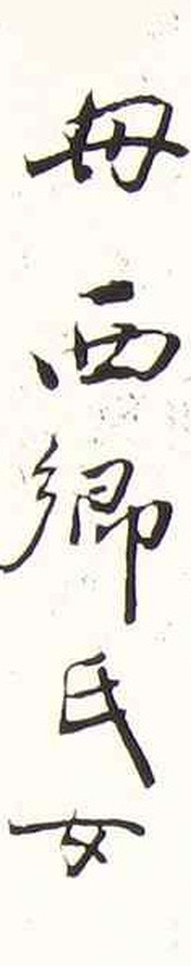母西郷氏女

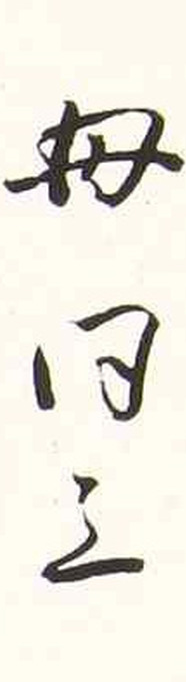母同上
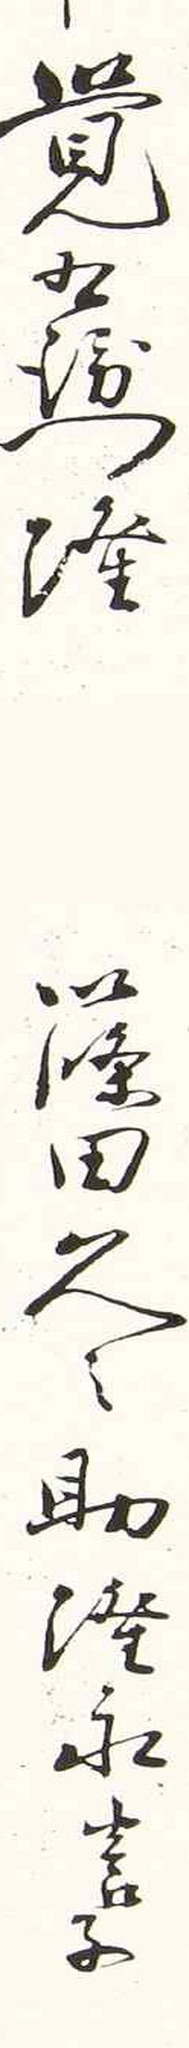覚右衛門隆篠田久之助隆永養子
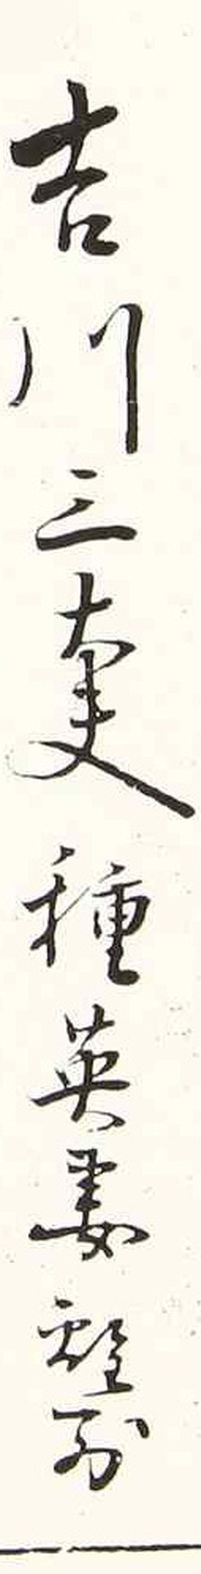吉川三大夫種英妻離別
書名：諸士系譜　巻之357　す之部7
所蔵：会津若松市立会津図書館
